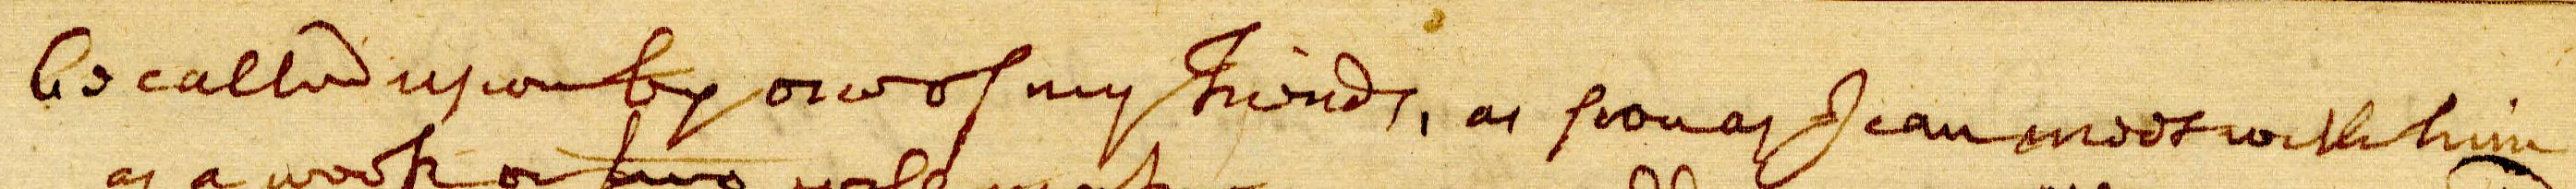be called upon by one of my Friends, as soon as I can meet will him
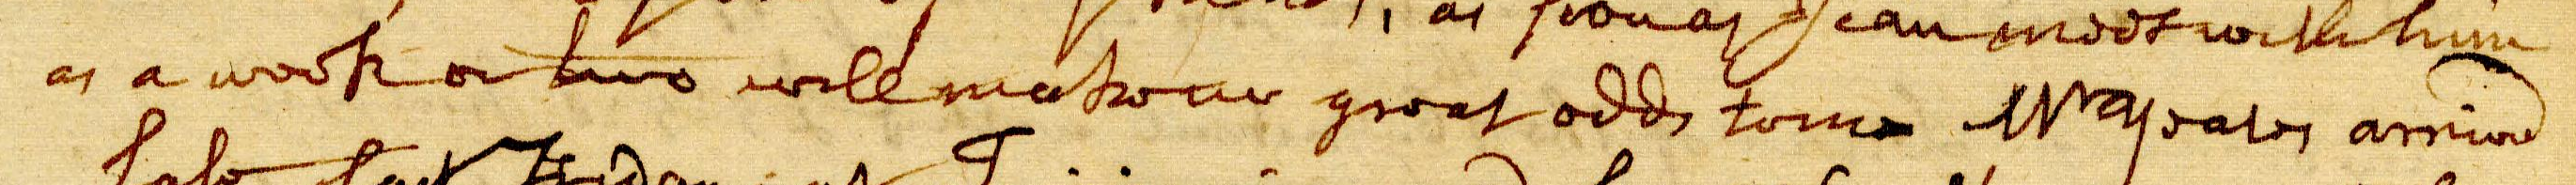as a week or two will make us great odds tom. M^r Yeates arrived
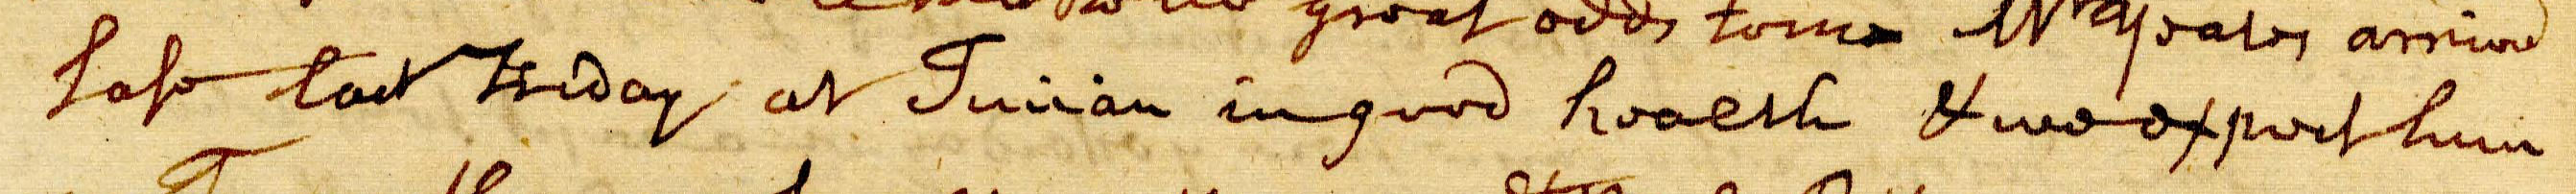Late last Friday at Julian in good health & we expect him
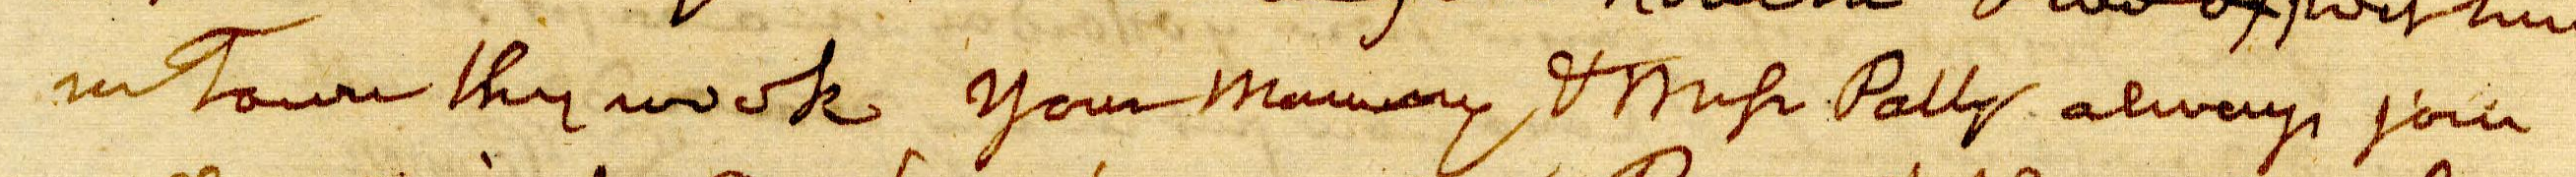in Town this Week Your Mammy & Miss Patty always join
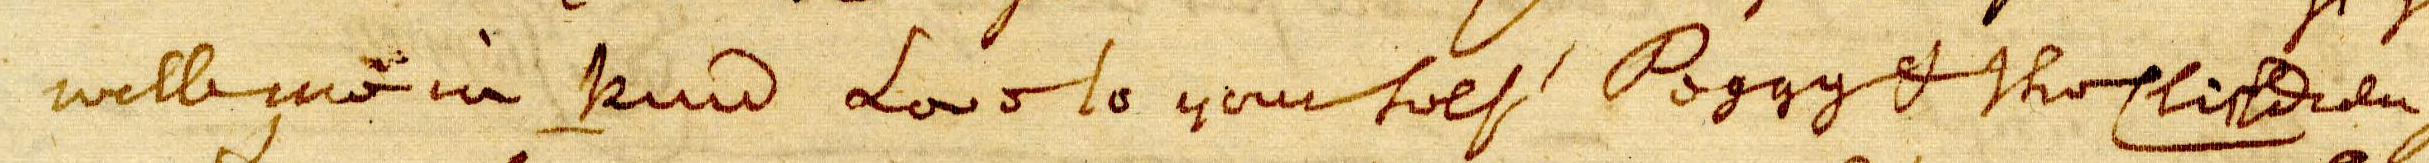with me in kind Love to your Self Peggy & the Children
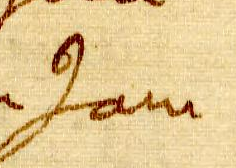I am
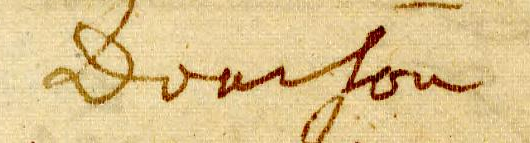Dear Son
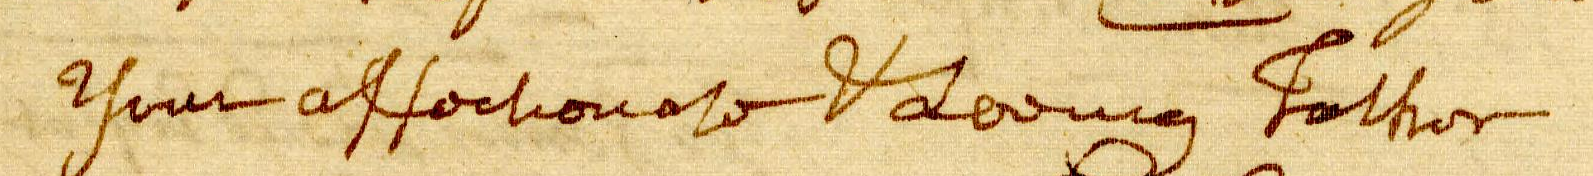Your affectionate & Loving Father
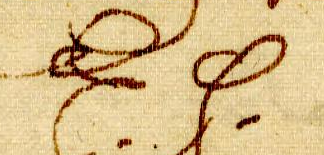E.S.
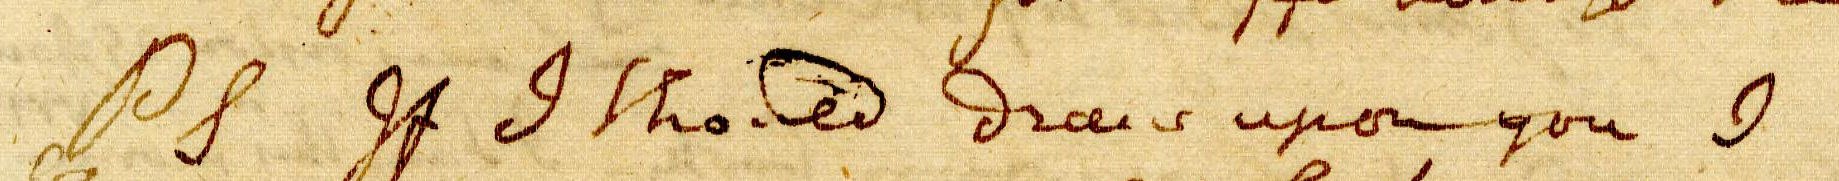PS If I should draw upon you I
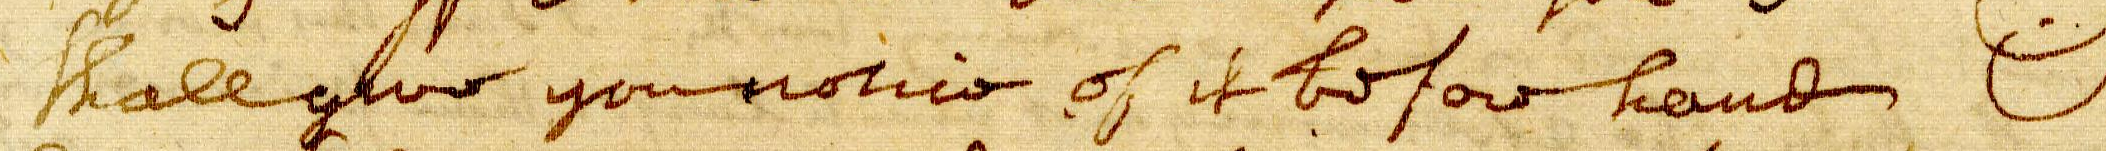shall give you notice of it before hand
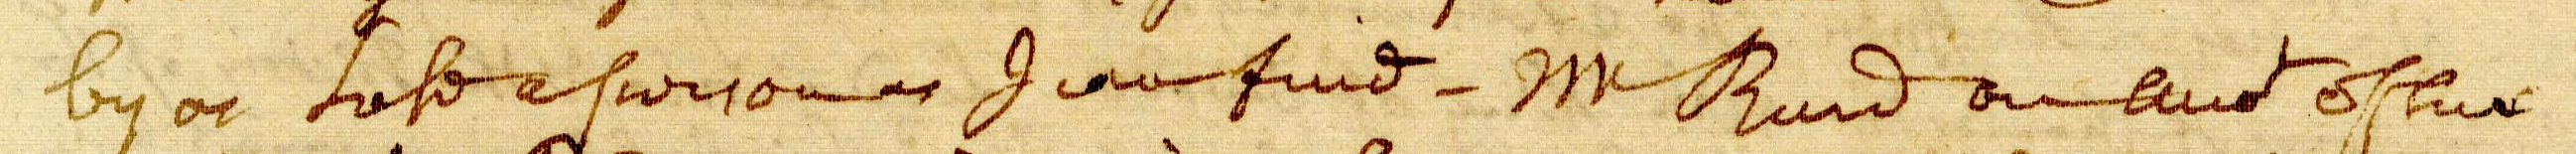by a Less as sure as I can find- M Burd on Acco^t of his
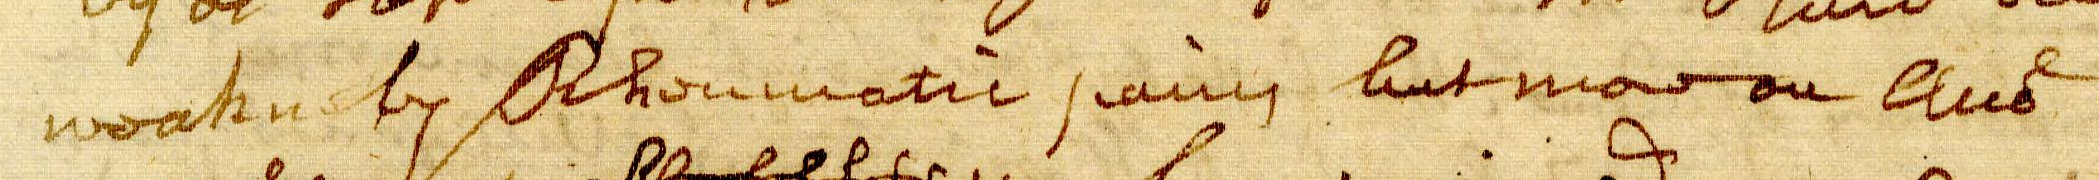weaknes by Rheumatic pains but now on Acco^t
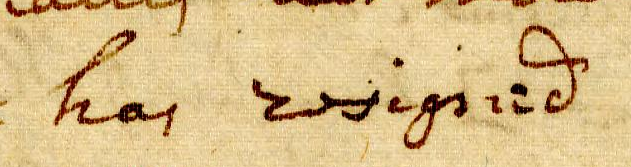has resigned
